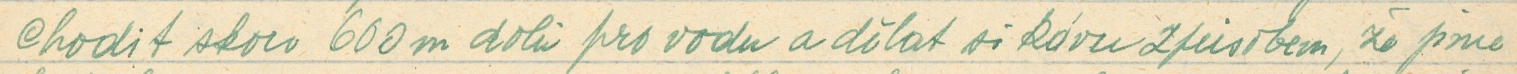chodit skoro 600 m dolů pro vodu a dělat si kávu způsobem, že jsme
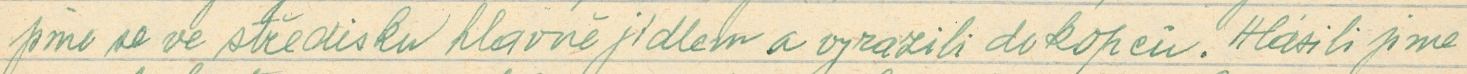jsme se ve středisku hlavně jídlem a vyrazili do kopců. Hlásili jsme
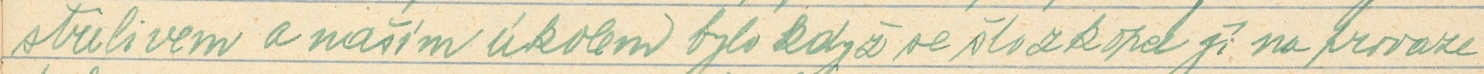střelivem a naším úkolem bylo když se šlo z kopce jí na provaze
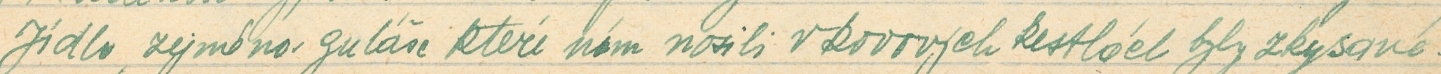Jídlo, zejména guláše které nám nosili v kovových kestlách byly zkysané.
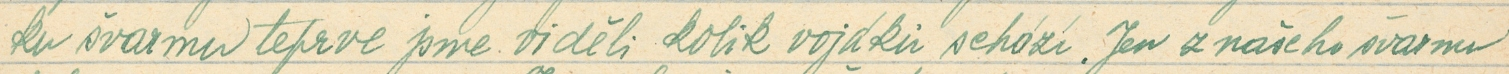ku švarmu teprve jsme viděli kolik vojáků schází. Jen z našeho švarmu
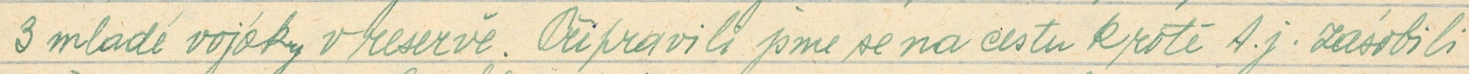3 mladé vojáky v reservě. Připravili jsme se na cestu k rotě t. j. zásobili
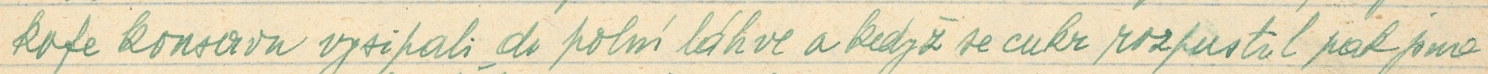kafe konservu vysipali do polní láhve a když se cukr rozpustil pak jsme
